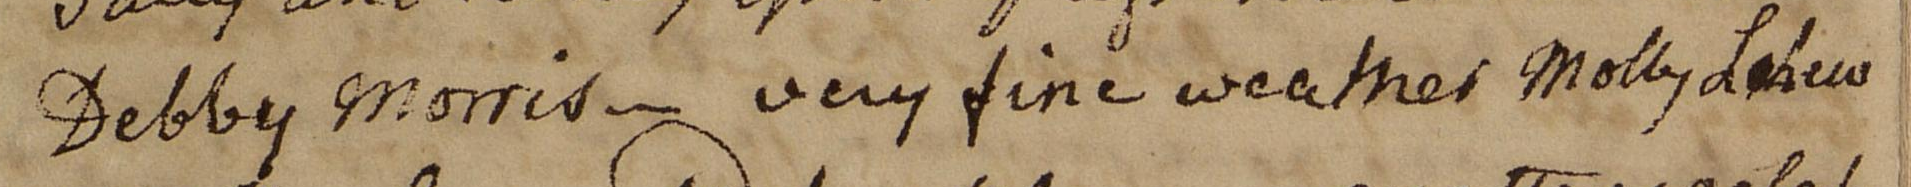Debby Morris- very fine weather Molly Lshew
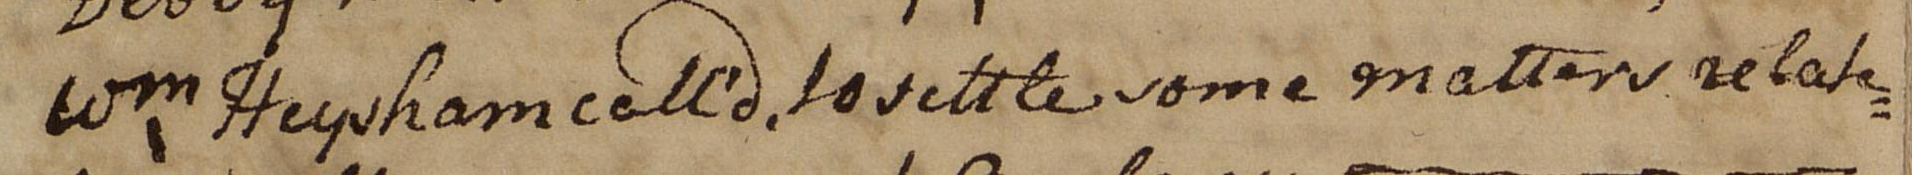W^m. Heysham call'd, to settle some matters, relate-
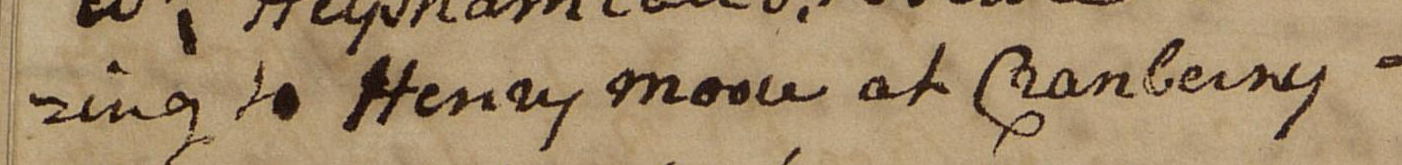-ing, to Henry Moore at Cranberry-
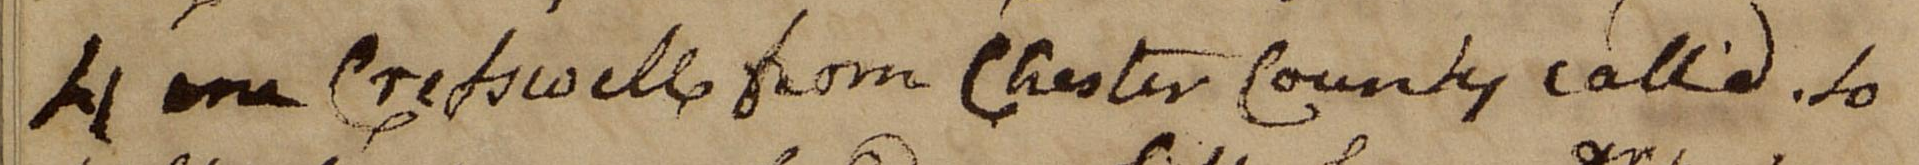4 one Cresswell from Chester County call'd to
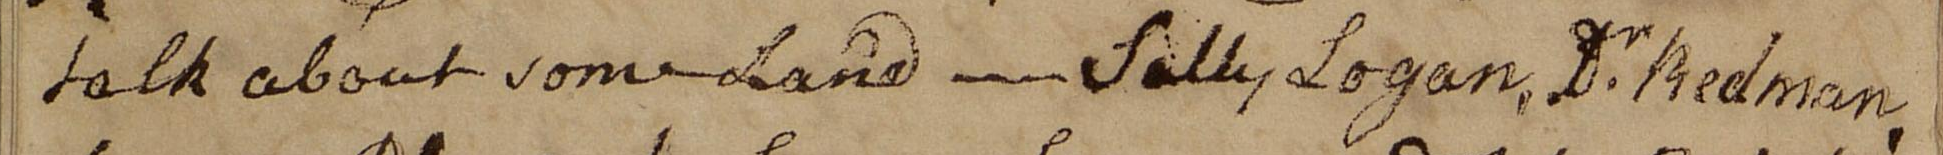talk about some Land- Sally Logan, D^r. Redman,
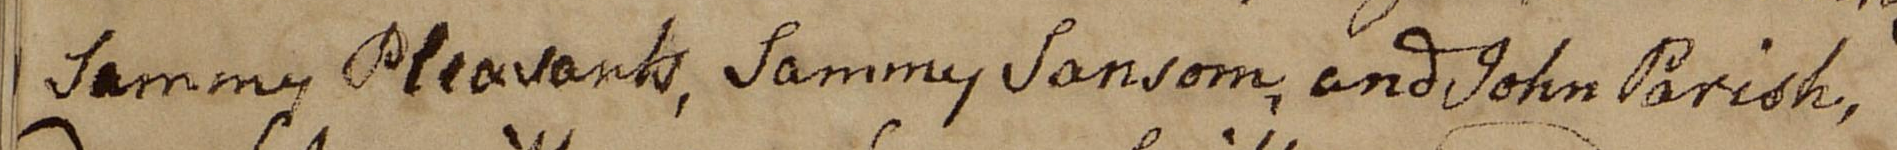Sammy Pleasants, Sammy Sansom, and John Parish,
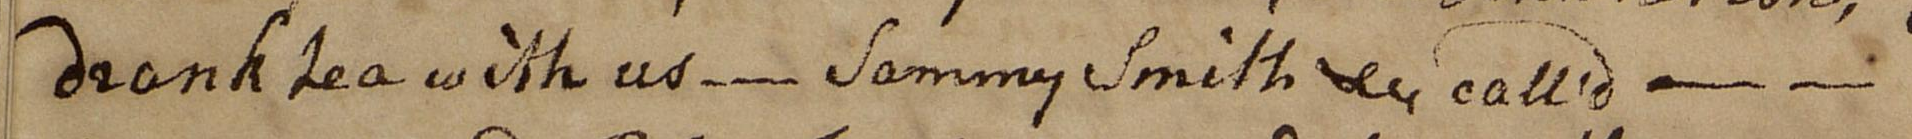drank tea with us- Sammy Smith &c call'd--
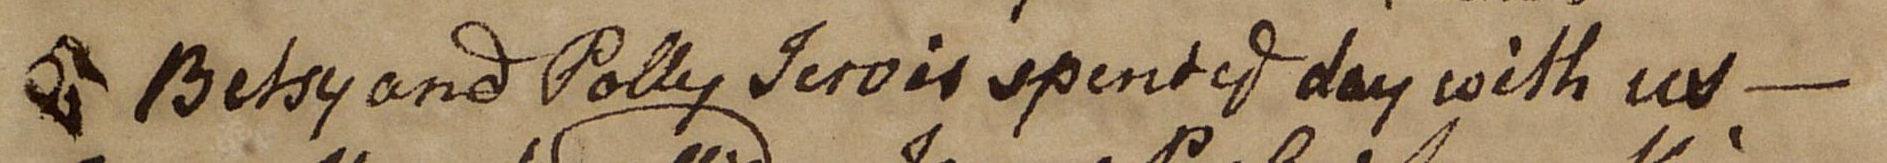5 Betsy and Polly Jervis spent y^e day with us-
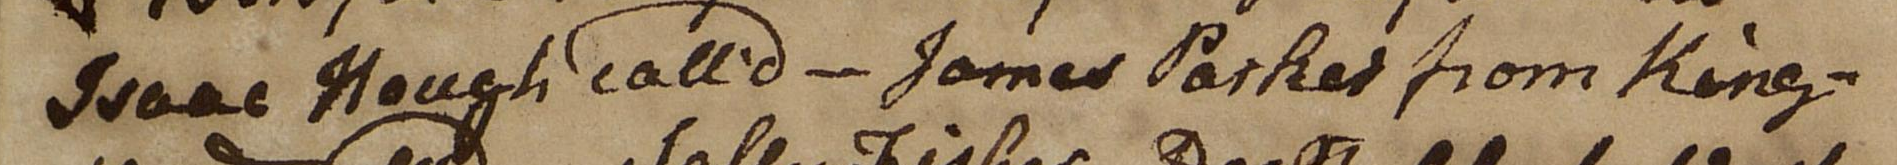Isaac Hough call'd- James Parker from King-
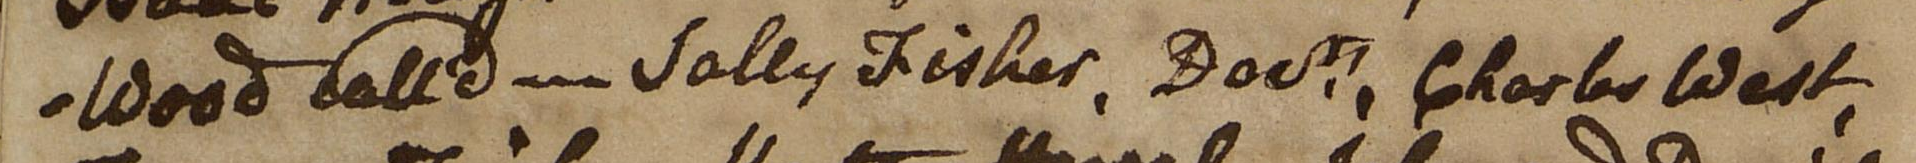Wood call'd- Sally Fisher, Doc^rs., Charles West,
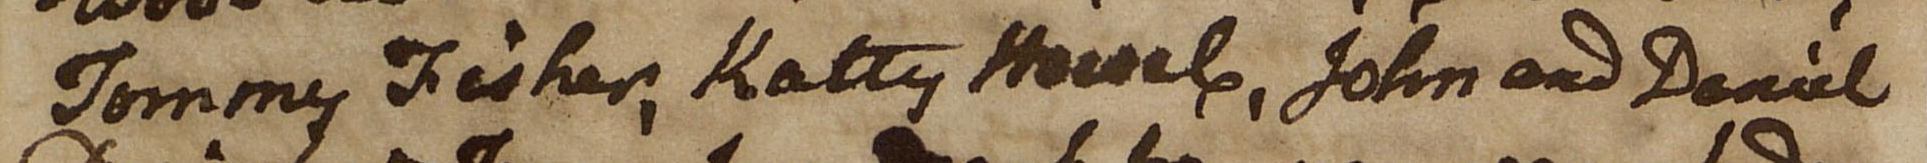Tommy Fisher, Katty Howel, John and Daniel
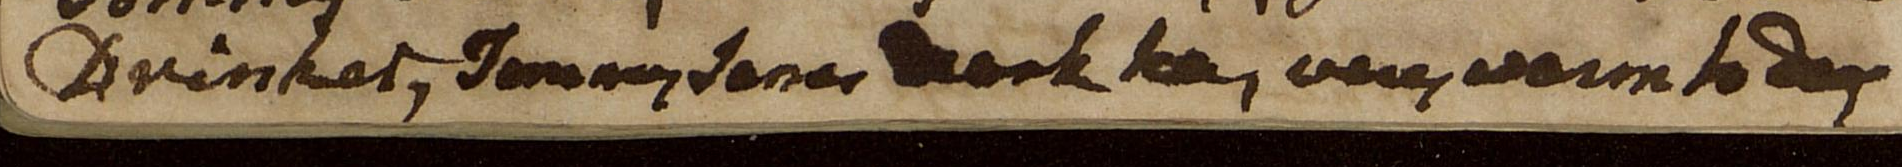Drinker, Tommy Jones drank tea, very warm to day
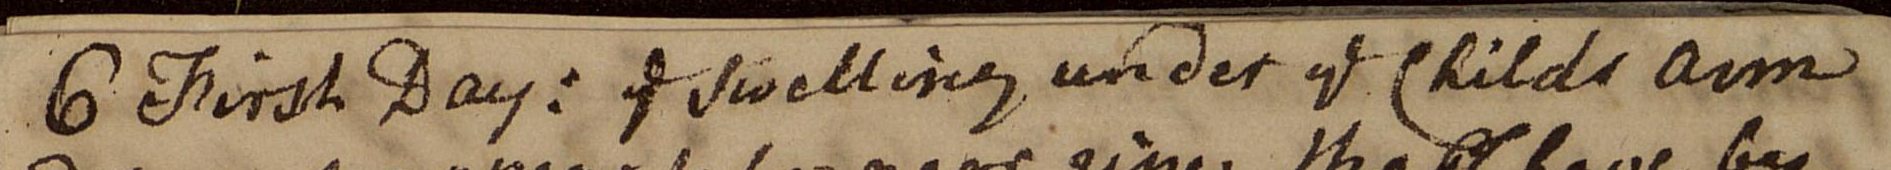6 First Day: y^e swelling under y^e Childs arm
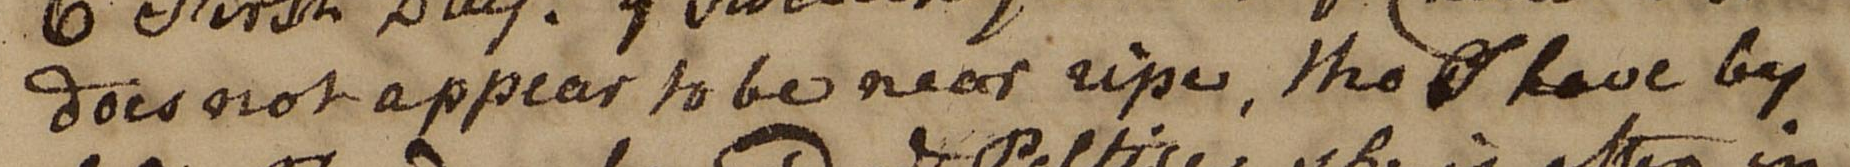does not appear to be near ripe, tho I have by
